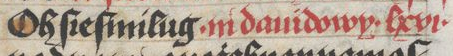Oh ſie ſmilugn dauidowy.lxvi.
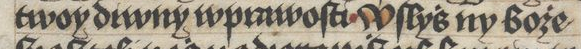twoy diwny wprawoſti.Vſlyṡ ny boże
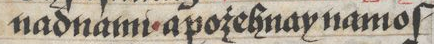nadnami.a pożehnay namoſ¬
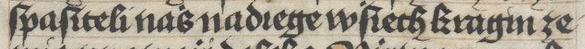ſpaſiteli naṡ nadiege wẛiech kragin ze¬
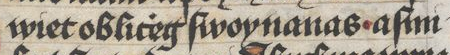wiet obliċeg ſwoy nanas.a ſmi¬
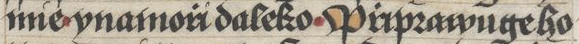mie.ynamoṙi daleko.Pṙiprawuge ho¬
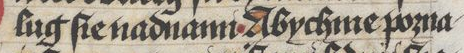lug ſie nadnami.Abychme pozna¬
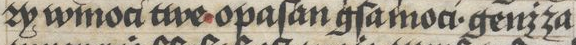zy wmoci twe.opaſan gſa mocí.genż za¬
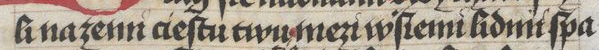li na zemi cieſtu twu.mezi wẛiemi lidmi ſpa¬
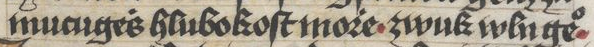mucugeṡ hlubokoſt moṙe.zwuk wln geo
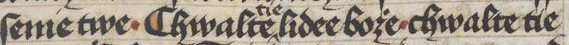ſenie twe.Chwalte tie lidee boże.chwalte tie¬
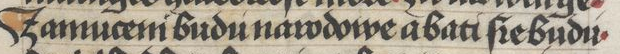Zamuceni budú narodowe a bati ſie budu.
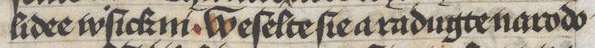lidee wẛickni.Weſelte ſie a radugte narodo¬
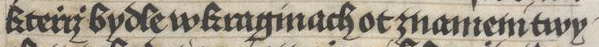kteṙiż bydle wkraginach ot znamem twy¬
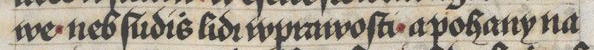we.neb ſudíṡ lidi wprawoſti.a pohany na¬
